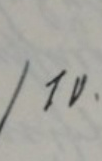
10
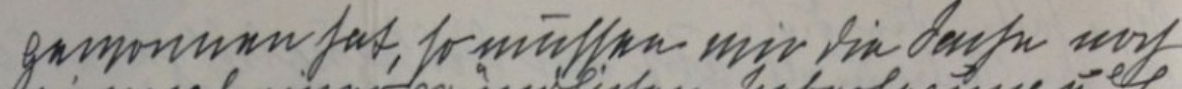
gewonnen hat, so müssen wir die Sache noch
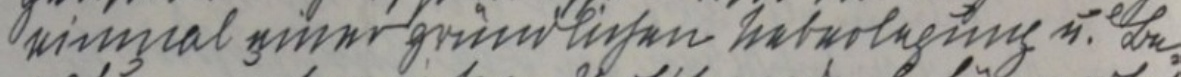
einmal einer gründlichen Ueberlegung u. Be
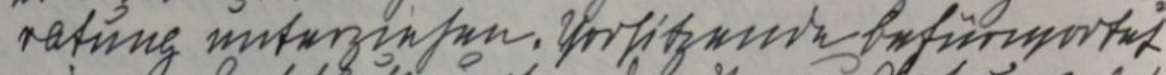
ratung unterziegen. Vorsitzende beführwortet
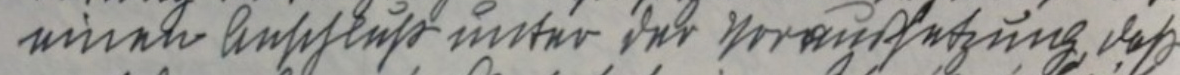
einen Anschluß unter der Vorraussetzung, daß
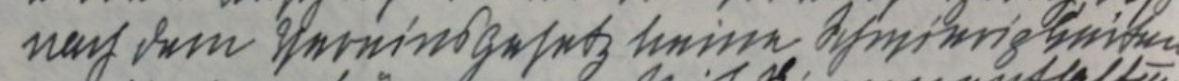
nach dem Vereinsgesetz keineSchwiereigkeiten
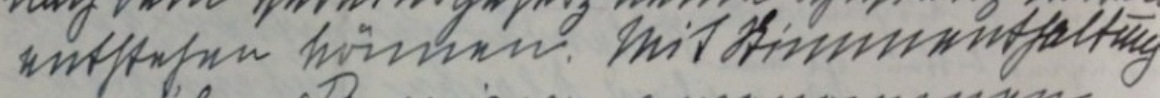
entstehen können. Mit Stimmenthaltung
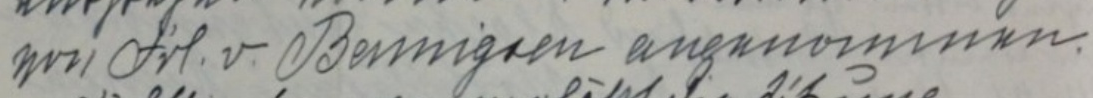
von Frl. v. Bennigsen angenommen.
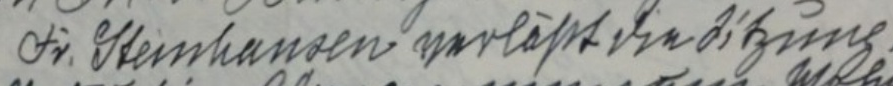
Fr. Steinhausen verläßt die Sitzung.
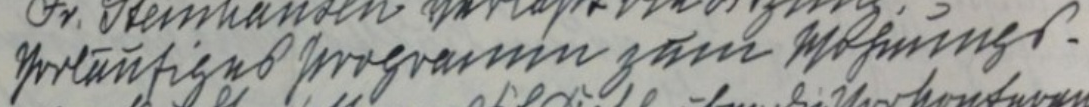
Vorläufiges Programm zum WOhnungs
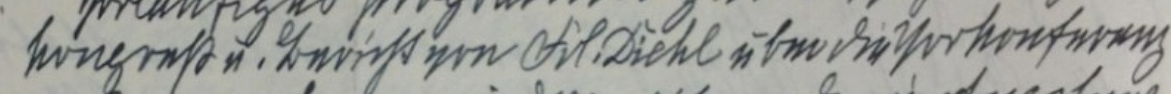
kongreß u. Bericht von Frl. Diehl über die Vorkonferenz.
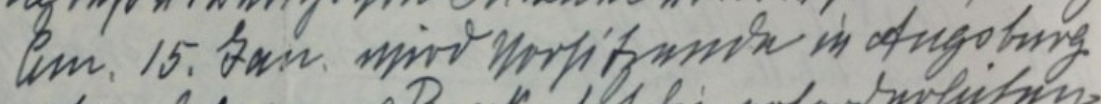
Am 15. Jan. wird Vorsitzende in Augsburg
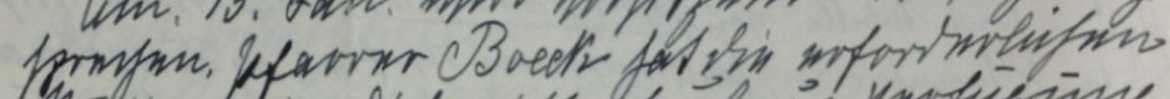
sprechen. Pfarrer Boeck hat die erforderlichen
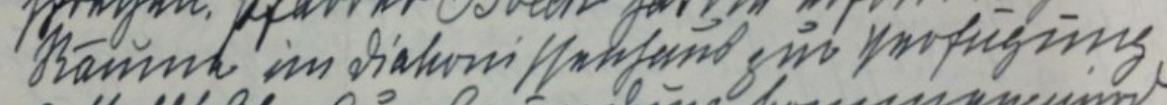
Räume im Diakonissenhaus zur Verfügung
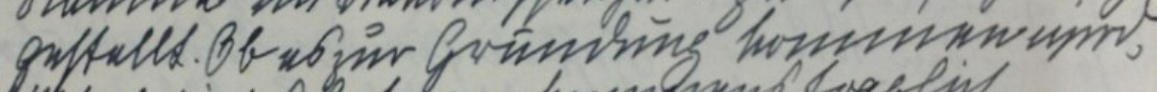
gestellt. Ob es zur Gründung kommen wird
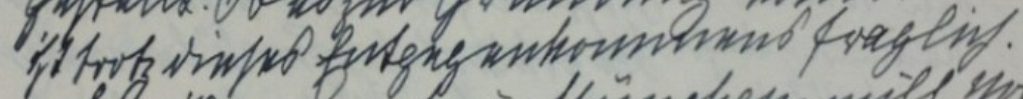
ist trotz unseres Entgegenkommens fraglich.
